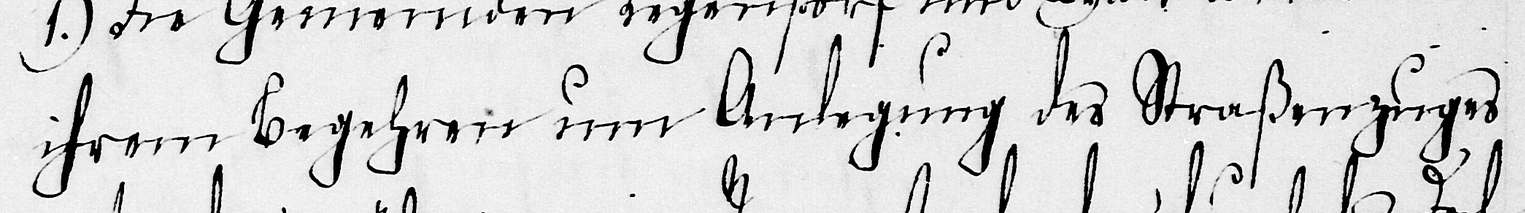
ihrem Begehren um Anlegung des Straßenzuges
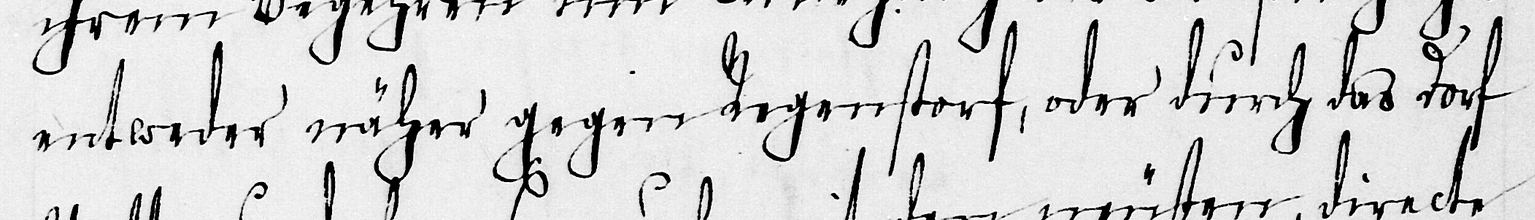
entweder näher gegen Regenstorf, oder durch das Dorf
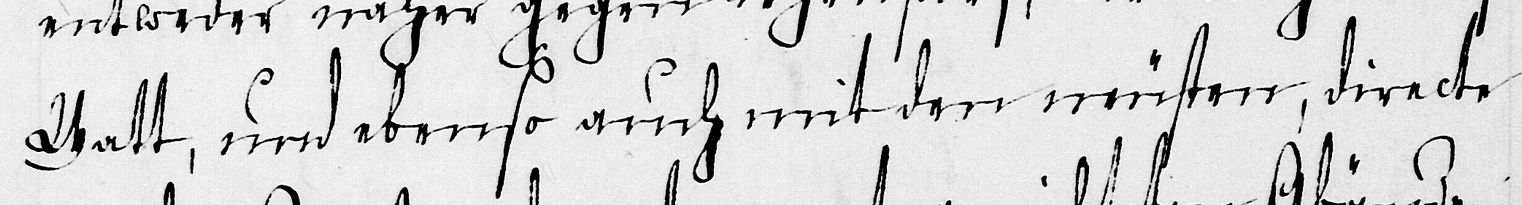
Watt, und ebenso auch mit den neusten, directe
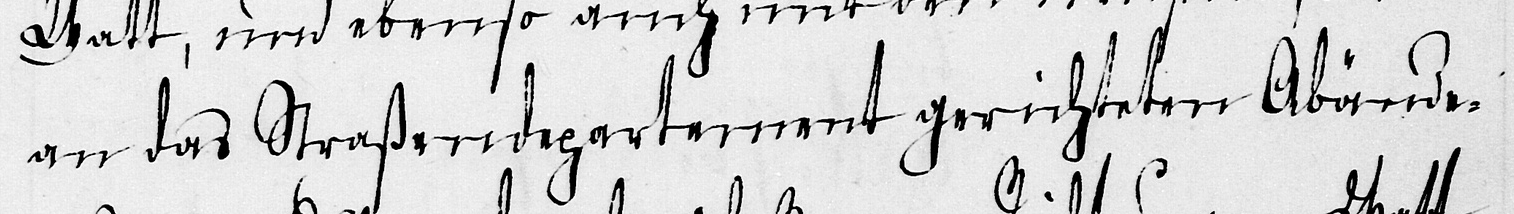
an das Straßendepartement gerichteten Abände¬
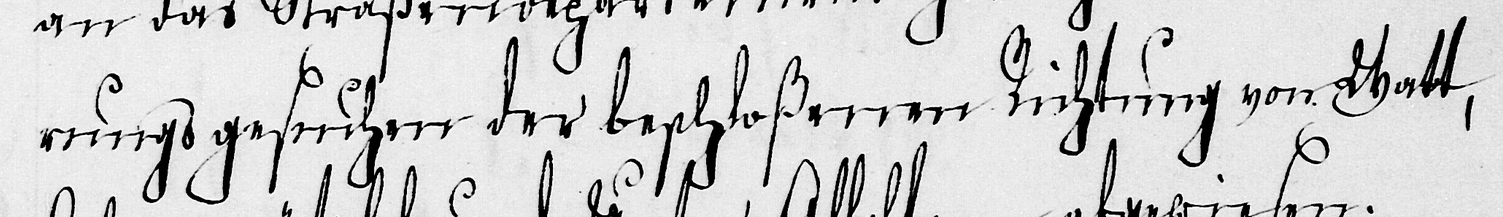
rungsgesuchen der beschloßenen Richtung von Watt,
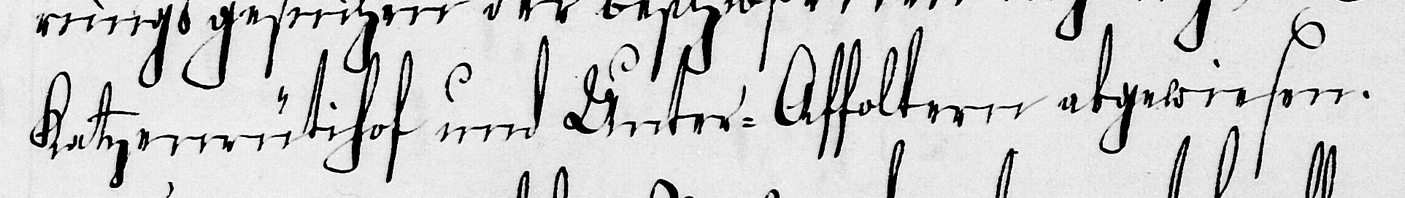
Katzenrütihof und Unter-Affoltern abgewiesen.
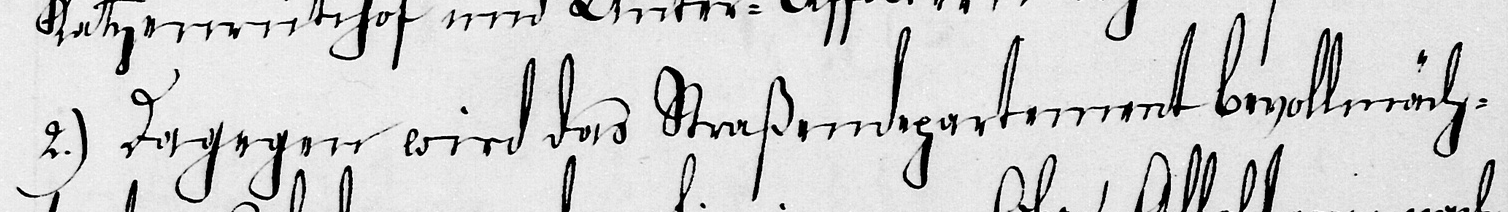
2.) Dagegen wird das Straßendepartement bevollmäch¬
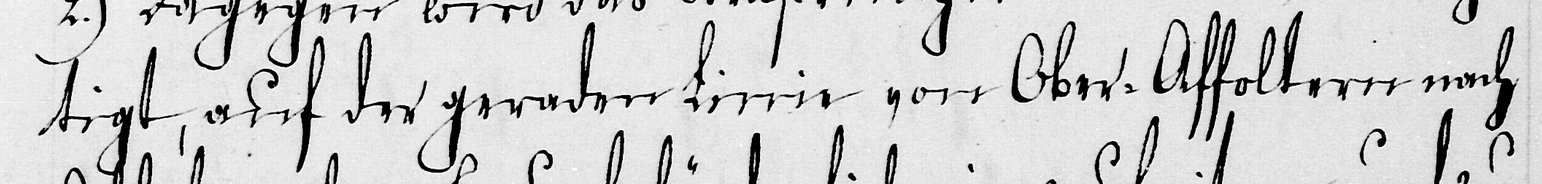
tigt, auf der geraden Linie von Ober-Affoltern nach
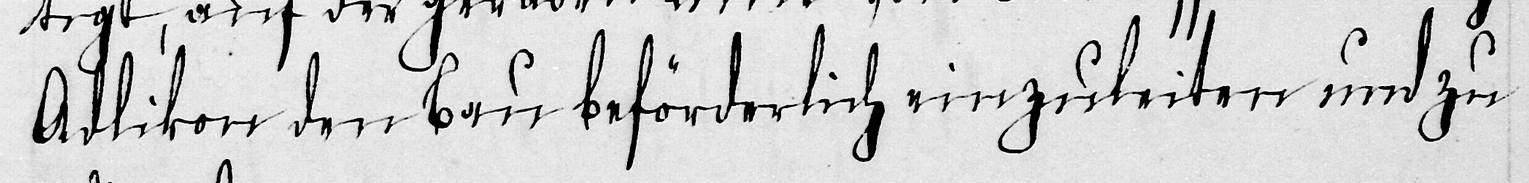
Adlikon den Bau beförderlich einzuleiten und zu
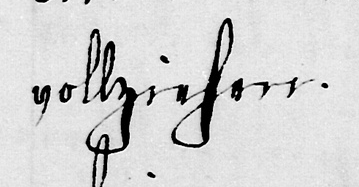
vollziehen.
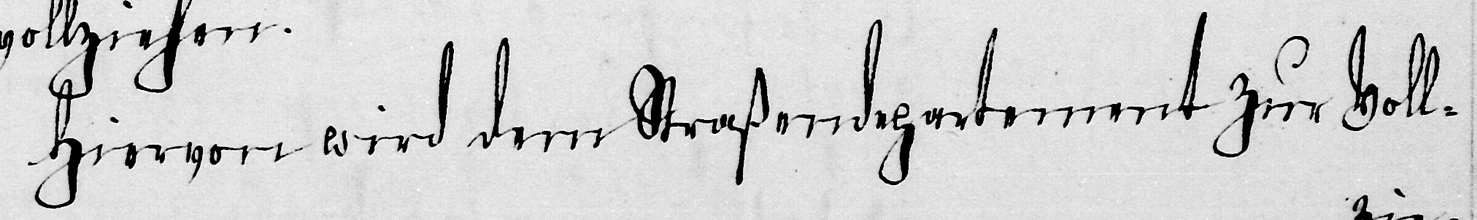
Hiervon wird dem Straßendepartement zur Voll-
